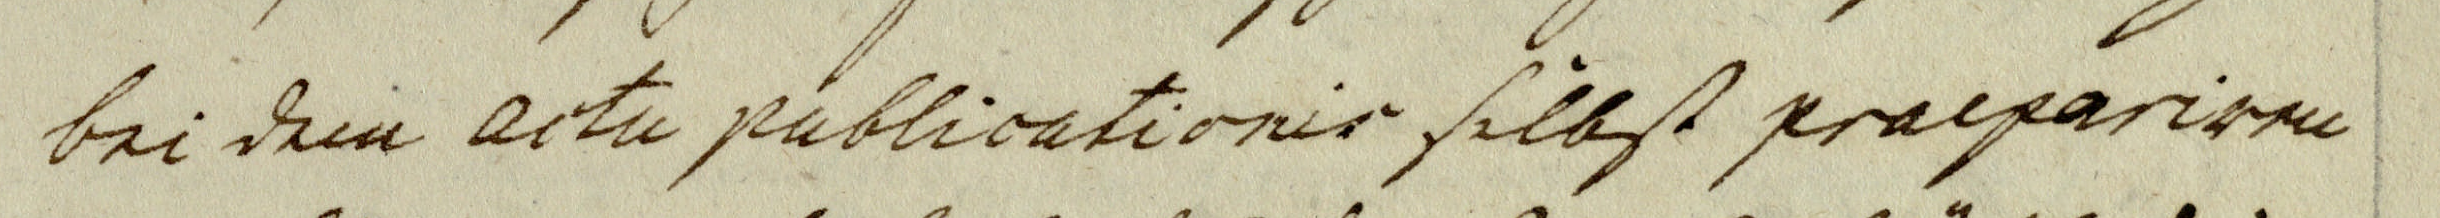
bei dem Actu publicationis selbst praepariren
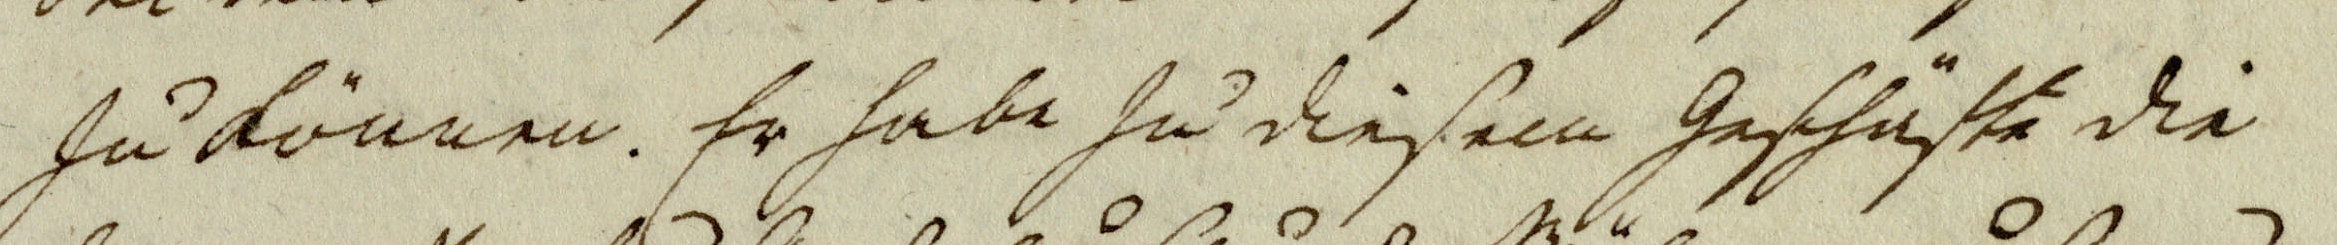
zu können. Er habe zu diesem Geschäfte die
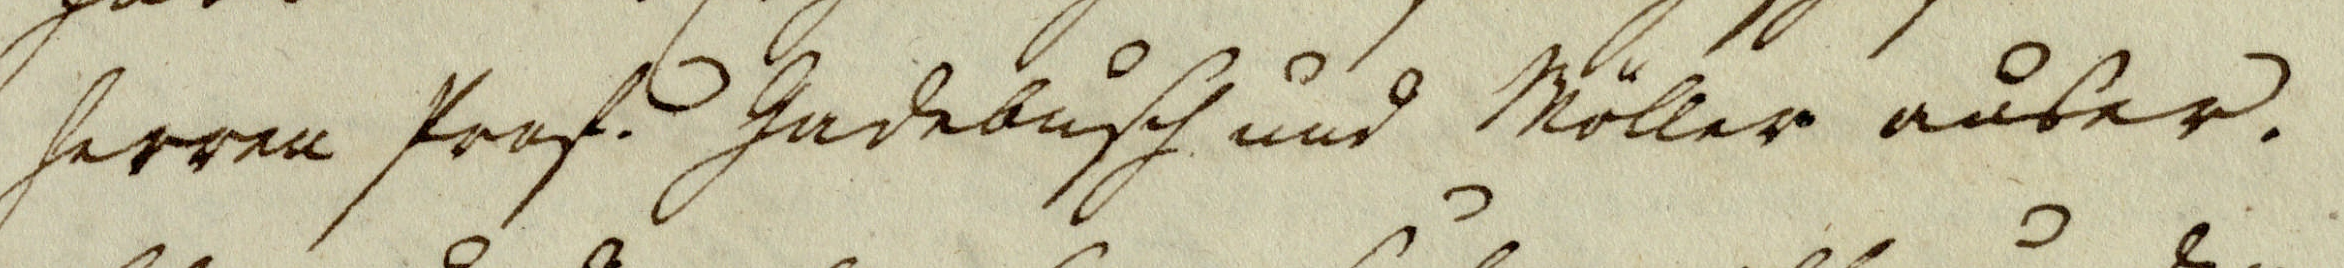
Herren Prof. Gadebusch und Möller auser¬
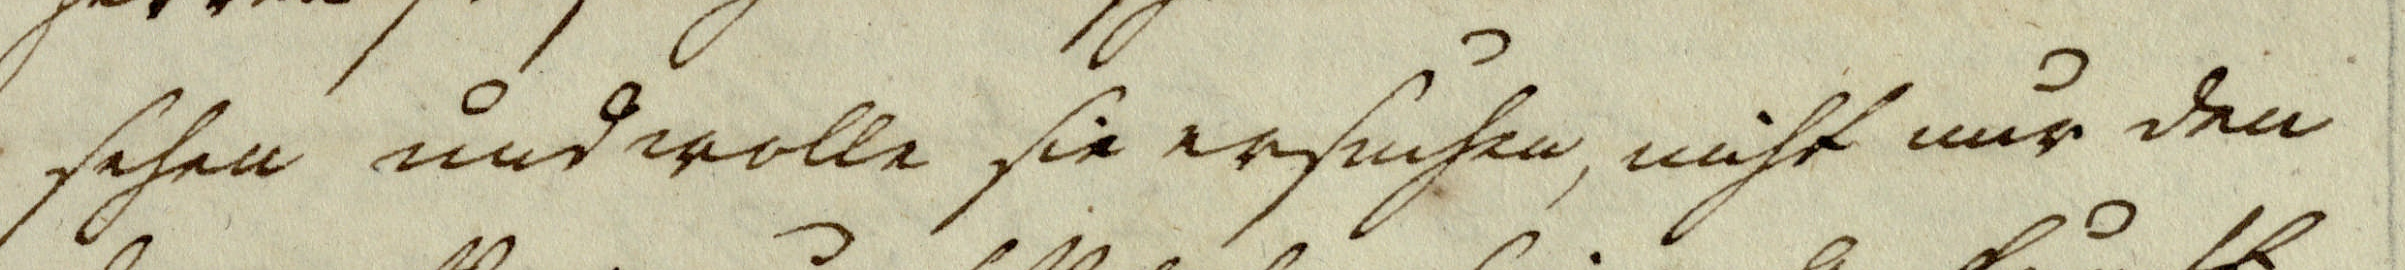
sehen und wolle sie ersuchen, nicht nur den
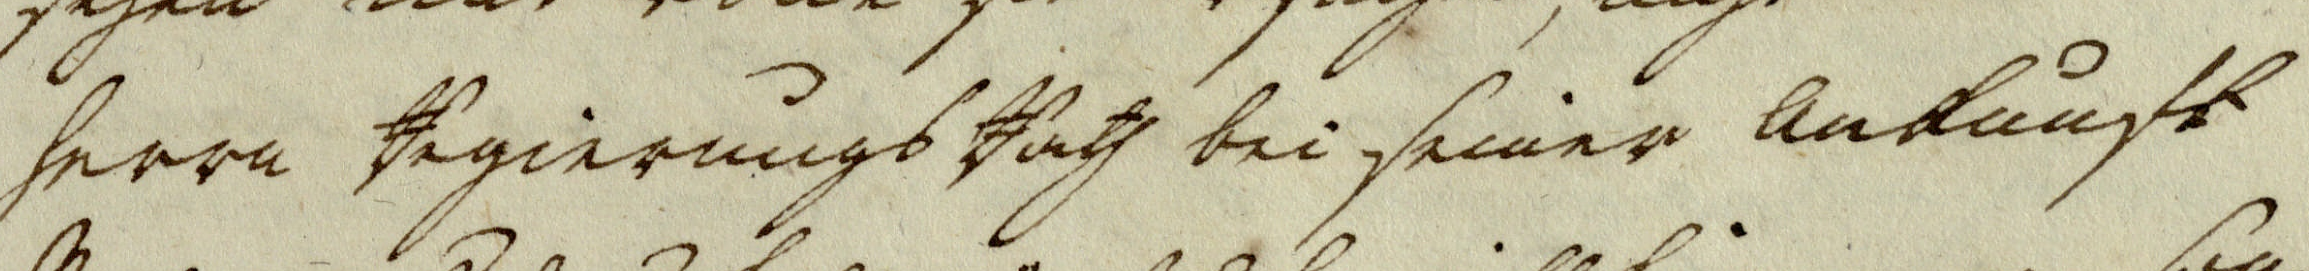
Herrn Regierungs Rath bei seiner Ankunft
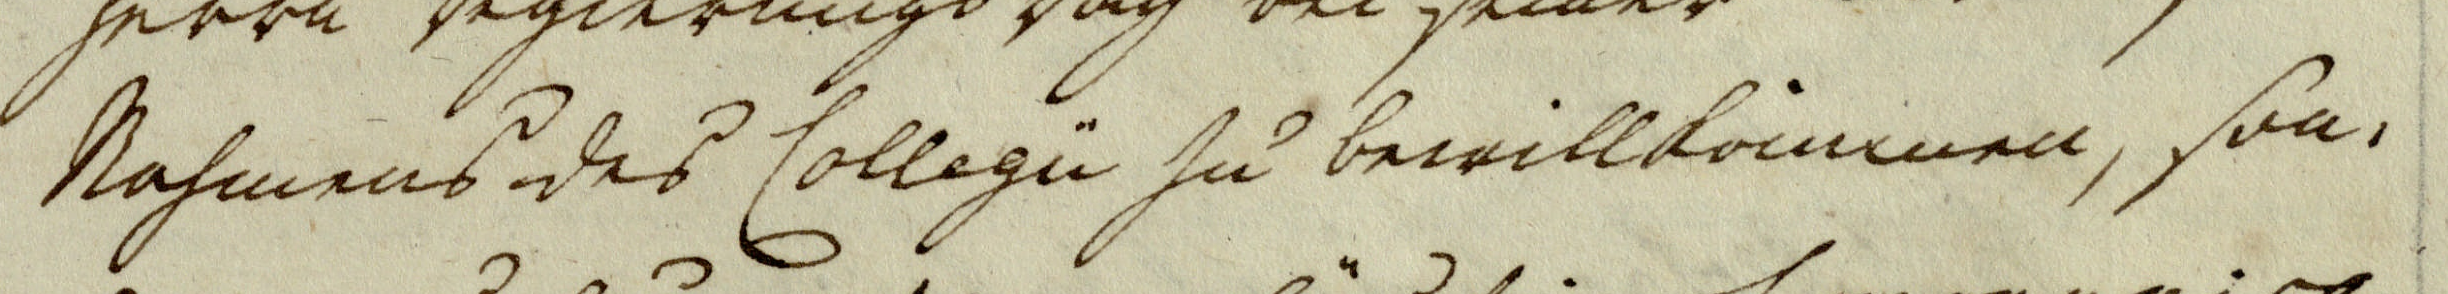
Nahmens des Collegii zu bewillkommen, son¬
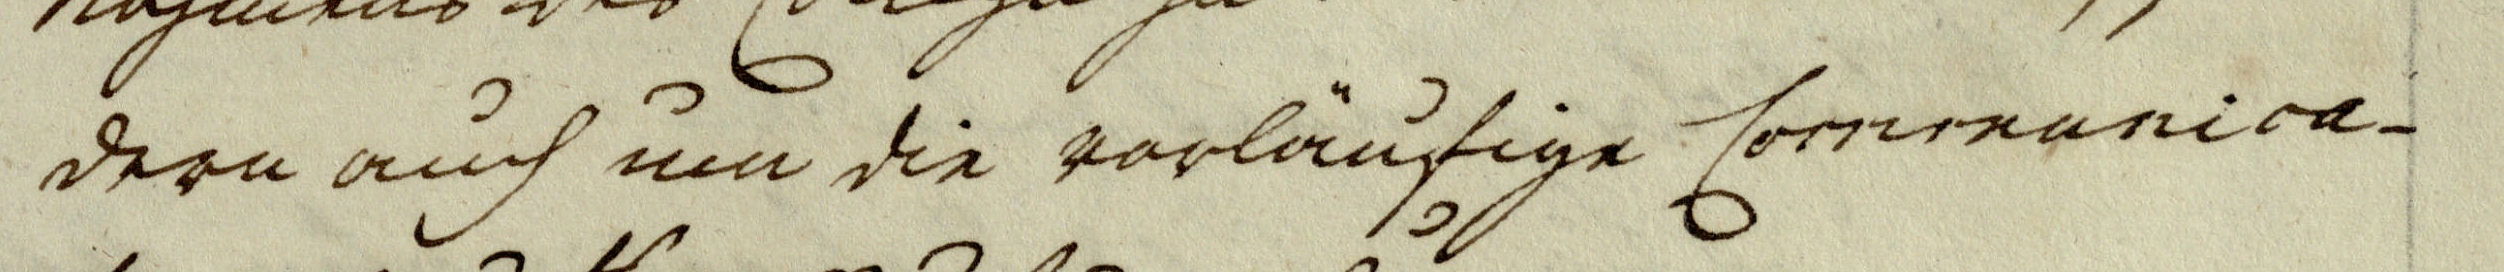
dern auch um die vorläufige Communica¬
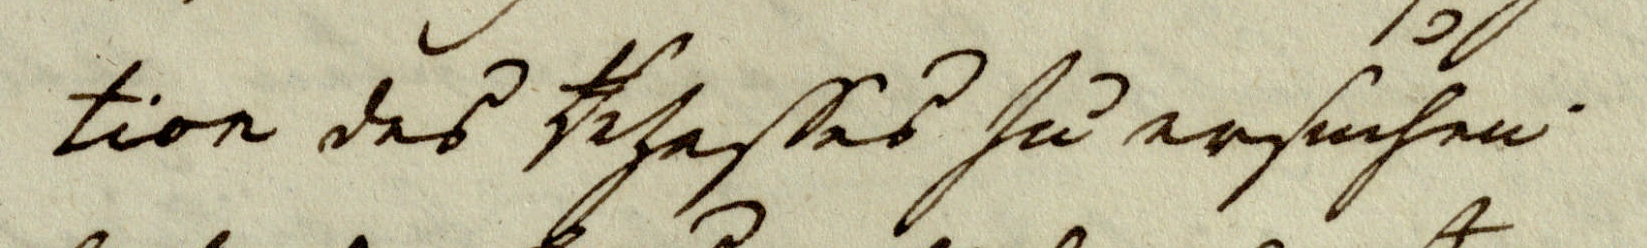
tion des Rezesses zu ersuchen
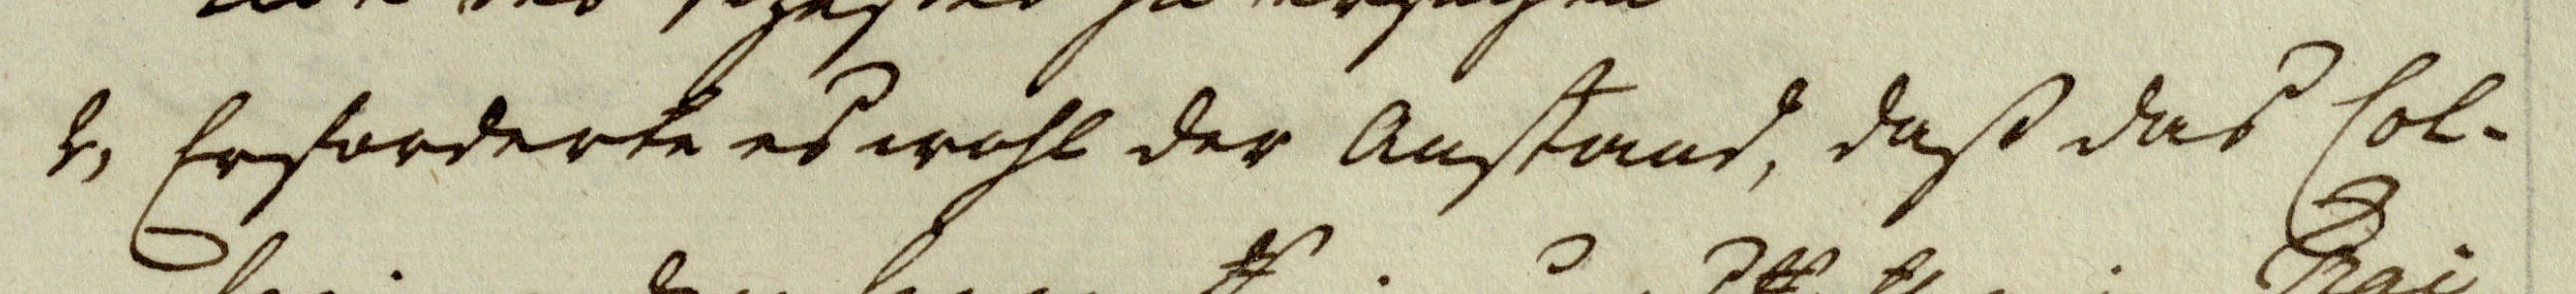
2., Erforderte es wohl der Anstand, daß das Col¬
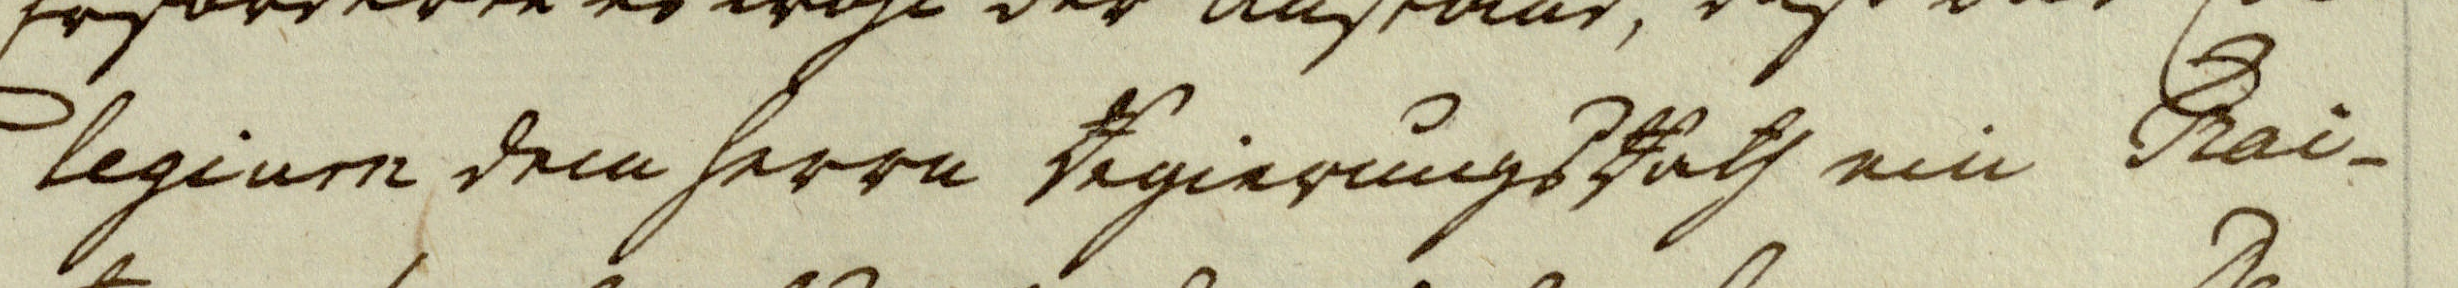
legium dem Herrn Regierungs Rath ein eine
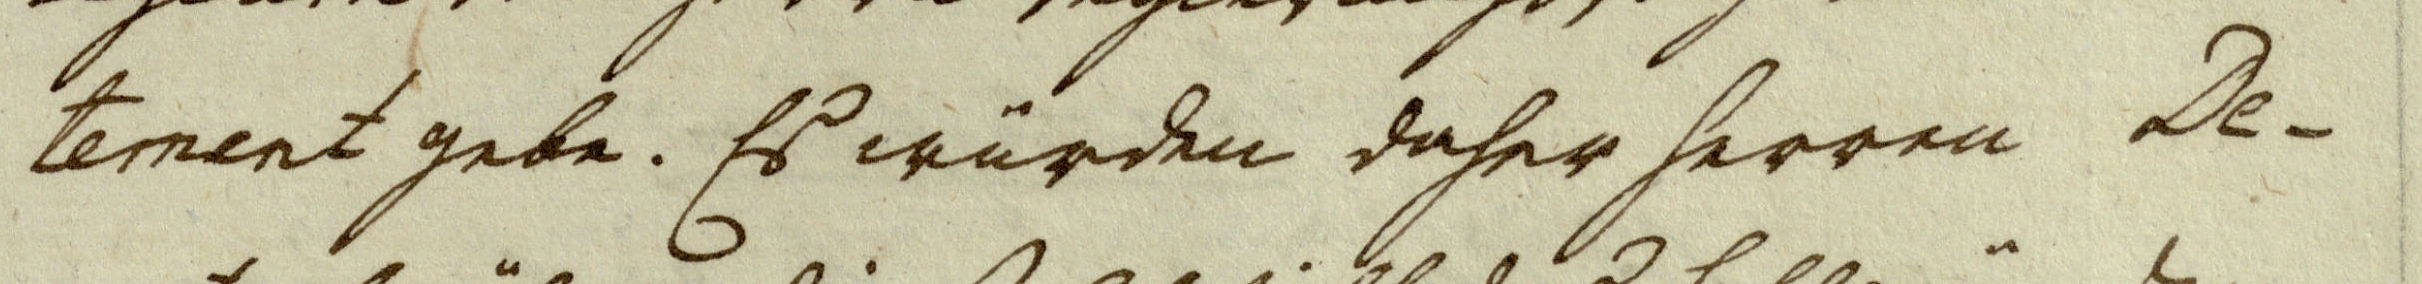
tment gebe. Es würden daher Herren D
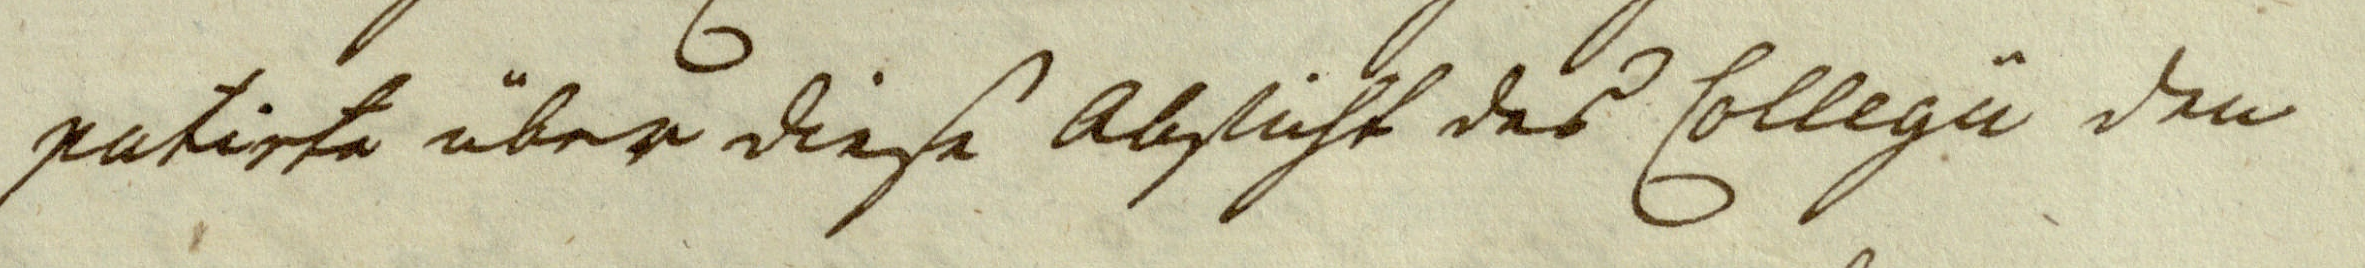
putirte über diese Absicht des Collegii den
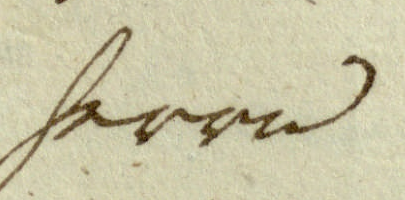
herrn
